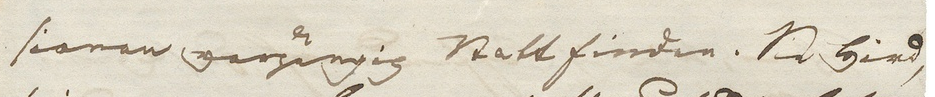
sionen vorgängig stattfinden. Sie wird,
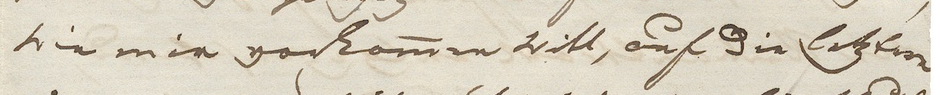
wie mir vorkommen will, auf die letztere
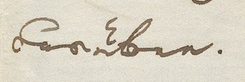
ausüben.
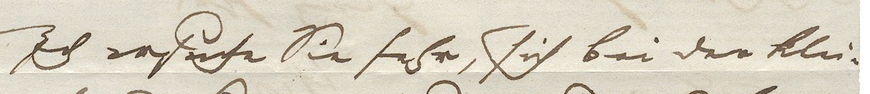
Ich ersuche Sie sehr, sich bei der klei-
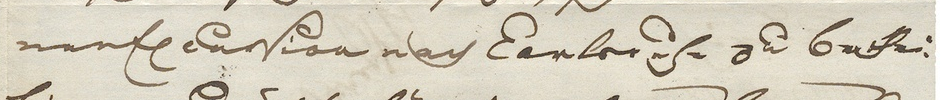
nen Excursion nach Karlsruhe zu bethei-
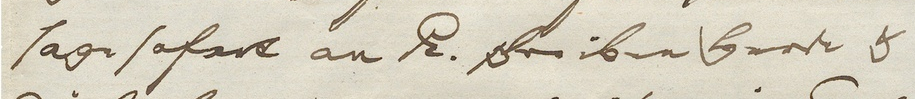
sage sofort an R. schreiben werde &
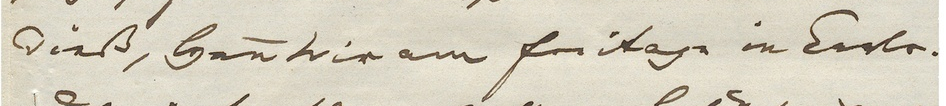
dieß, wenn wir am Freitage in Karls-
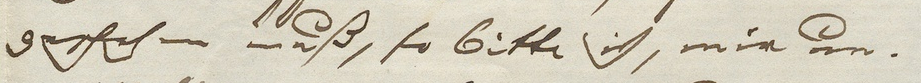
geschehen muß, so bitte ich, mir un-
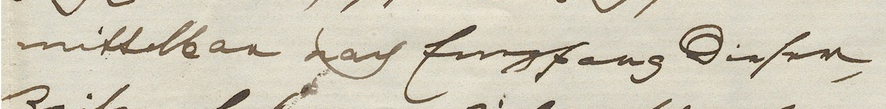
mittelbar nach Empfang dieser
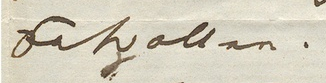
zu wollen.
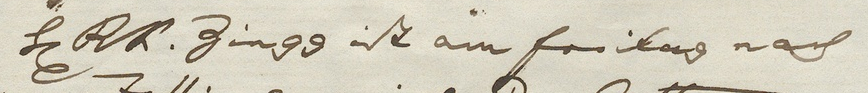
Herr RR. Zingg ist am Freitag nach
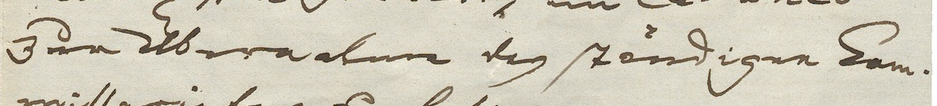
zur Übernahme des ständigen Kom-
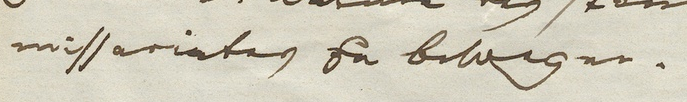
missiariates zu bewegen.
